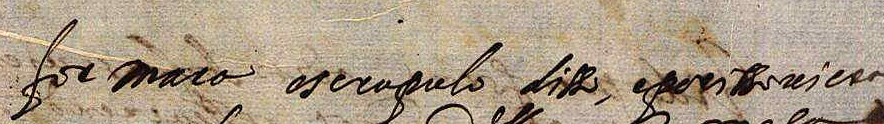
formara escrupulo disso, e por isso uiera
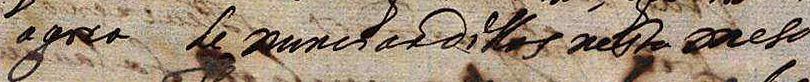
agora denunciar dellas nesta mesa
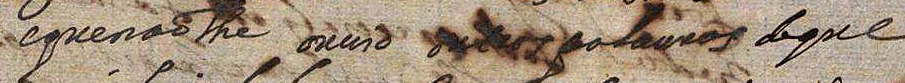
e que naõ lhe ouuio outras palauras de que
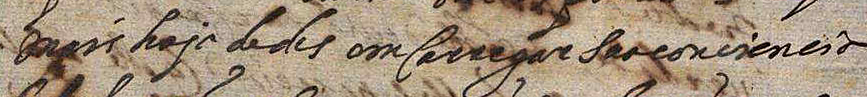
mais haja de desemCarregar sua conciencia
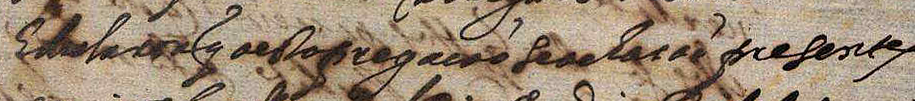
E declarou q̄ a esta pregaçaõ se acharaõ presentes
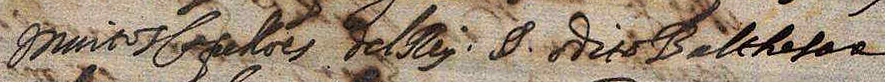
muitos Capelloẽs del Rey .ss. o dito Balthesar
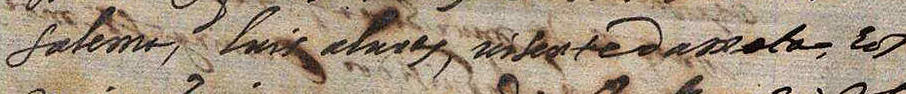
salema, luis alures, uisente da mata, E os
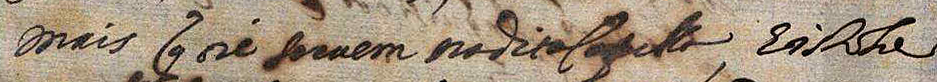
mais q̄ oie seruem na dita Capella, E isto he
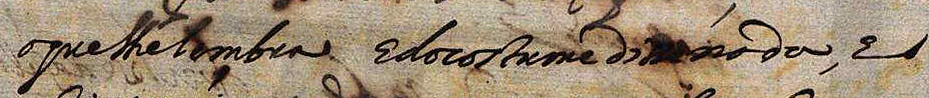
o que lhe lembra E do costume dise nada, E
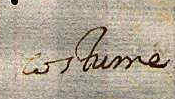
costume
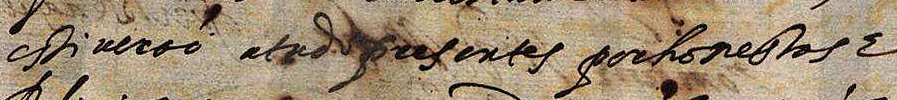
estiuerão a tudo presentes por honestas E
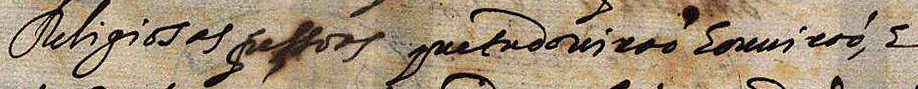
Religiosas pessoas que tudo uiraõ E ouuiraõ, E
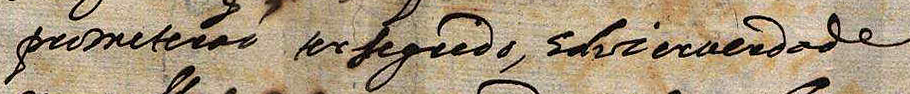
prometerão ter segredo, E dizer uerdade
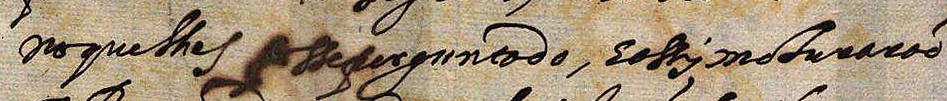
no que lhes fosse perguntado, E assym o Iuraraõ
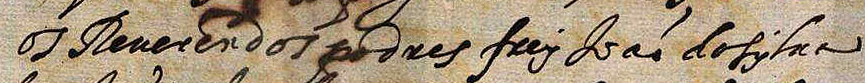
os Reuerendos padres frey Joaõ da sylua
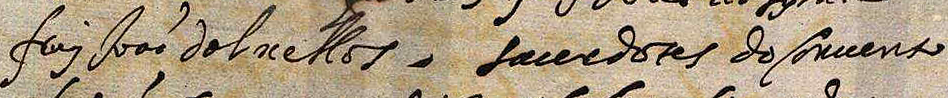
frey João daluellos sacerdotes do Conuento
